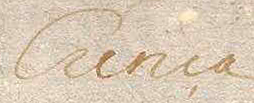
Crença
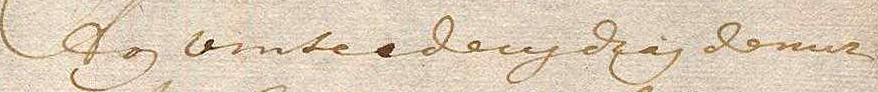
Aos vinte e dous dias do mez
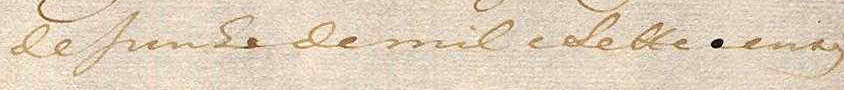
de Junho de mil e Settecentos
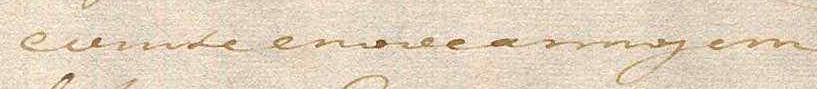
e vinte e nove annos em
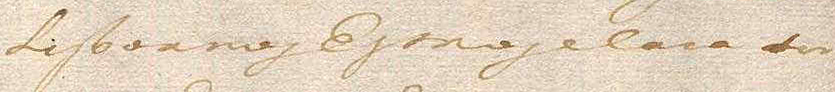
Lisboa nos Estaos e caza ter
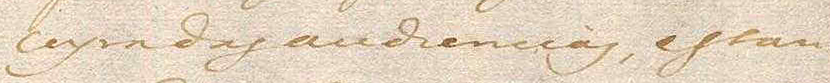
ceyra das audiencias, estan
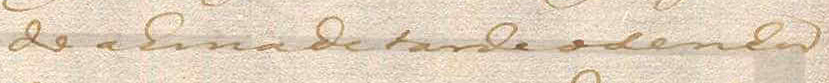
do ahi na de tarde o senhor
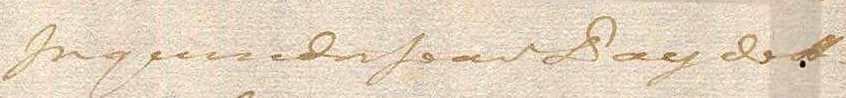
Jnquizidor Joaõ Paes do A
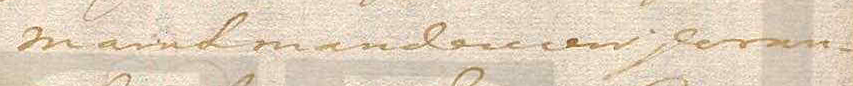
maraL mandou vir peran
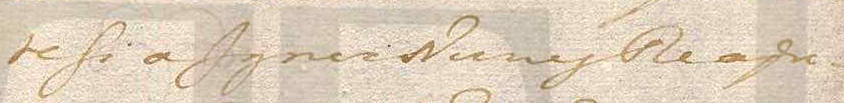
te si a Jgnez Nunes Re apre
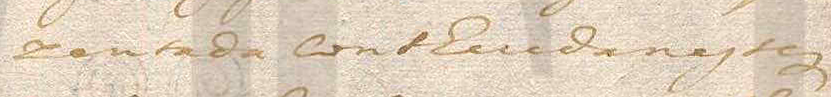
zentada contheuda nestes
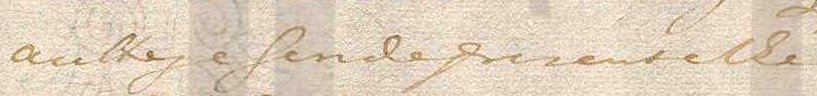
auttos e sendo prezente lhe
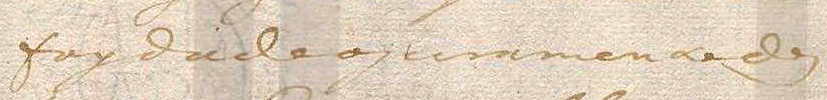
foy dado o juramento dos
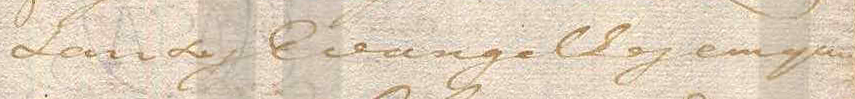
santos Evangelhos em que
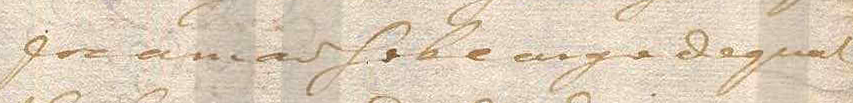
poz a maõ sob cargo do qual
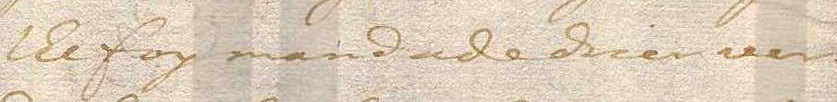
lhe foy mandado dizer ver
